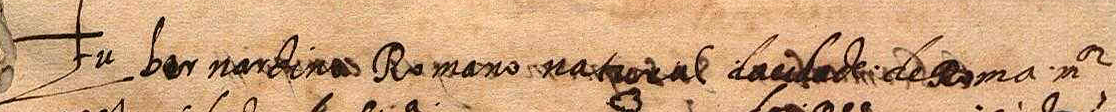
Eu bernardino Romano, natural da cidade de Roma mor
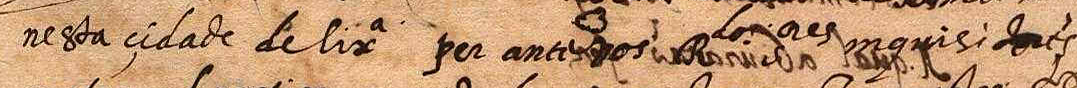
nesta cidade de lixa perante vos Rdos sores inquisidores
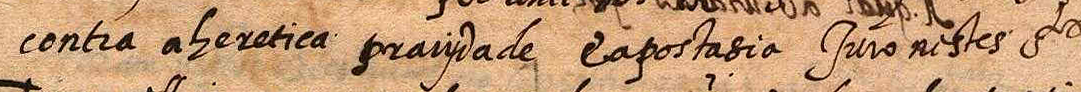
contra a heretica praujdade e apostasia Juro nestes stos
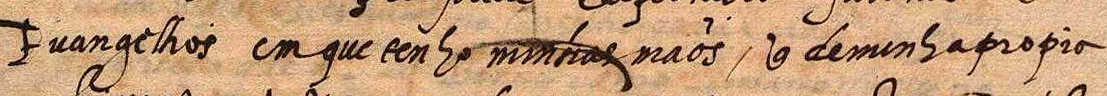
Euangelhos em que tenho minhas maõs / q̄ de minha propia
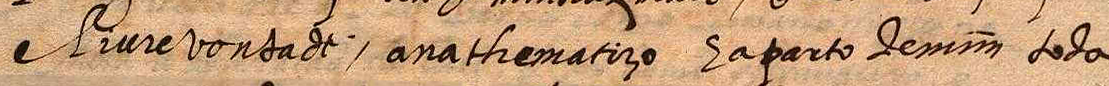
e Liure vontade / anathematizo E aparto de mīm toda
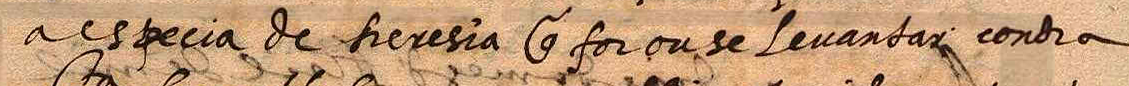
a especia de heresia q̄ for ou se Leuantar contra
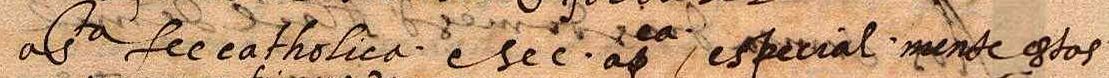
a sta fee catholica e see apca / especialmente estas
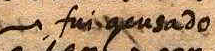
fui acusado
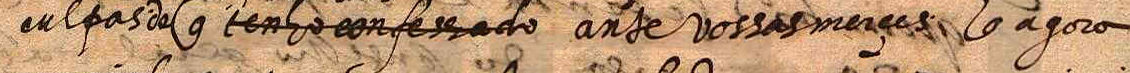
culpas de q̄ tenho confessado ante vossas merces q̄ agora
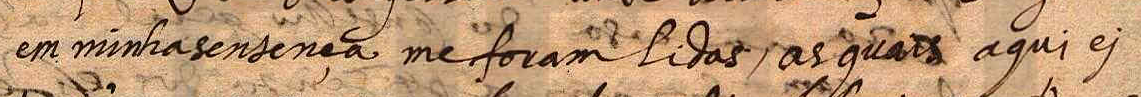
em minha sentença me foram Lidas / as quais aqui ej
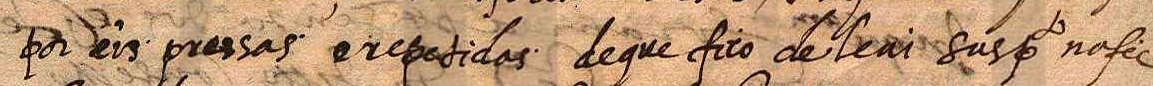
por eispressas e repetidas de que fico de leui suspto na fee
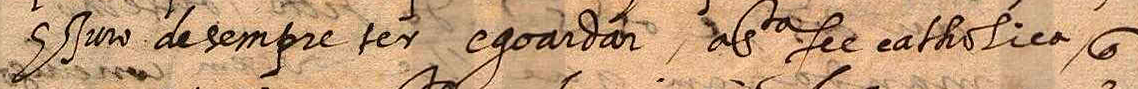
E Juro de sempre ter e goardar / a sta fee catholica / q̄
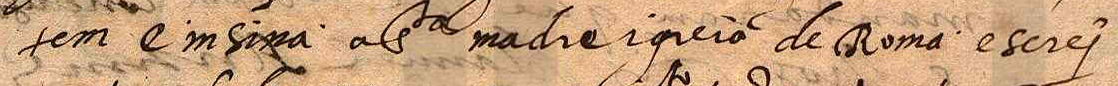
tem emsina a sta madre igreia de Roma e serej
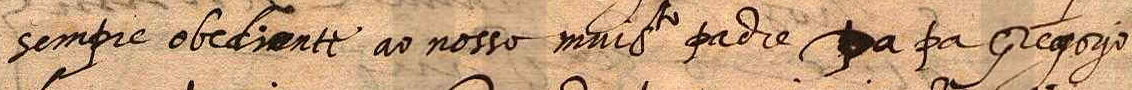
sempre obediente ao nosso mui sto padre papa gregorjo
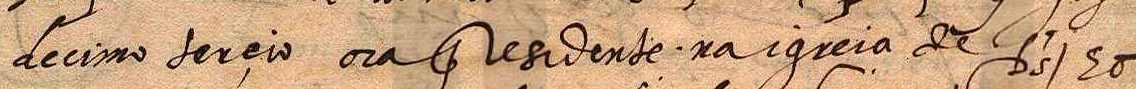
decimo tercio ora presidente na igreia de Ds̄ / E a
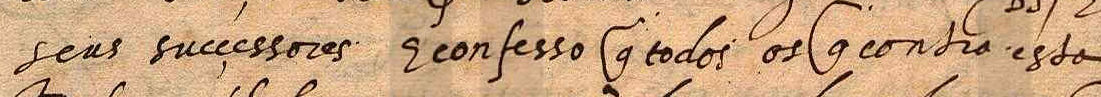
seus successores E confesso q̄ todos os q̄ contra esta
